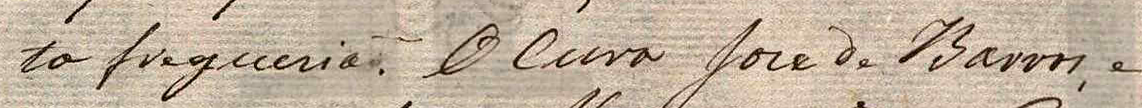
ta freguezia. O Cura Joze de Barros, e
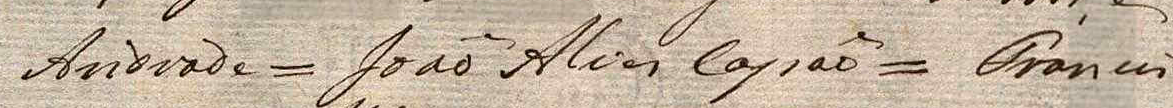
Andrade = Joaõ Alves Cassaõ = Francis
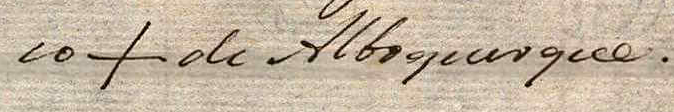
co + de Alboquerque.
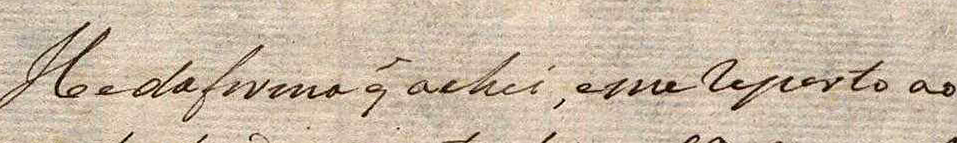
He da forma q̄ achei, e me Reporto ao
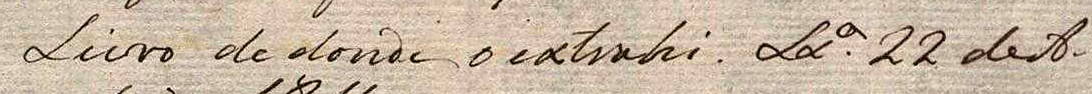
Livro de donde o extrahi. Lx.a 22 de A
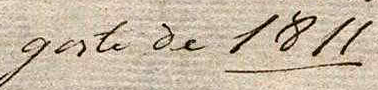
gosto de 1811.
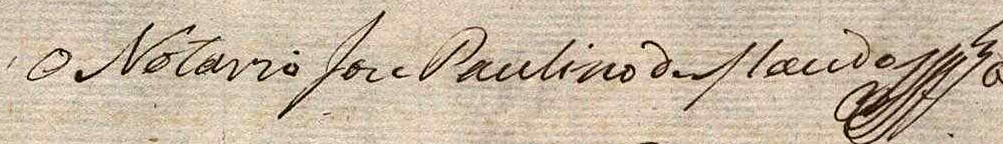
o Notario Joze Paulino de Macedo
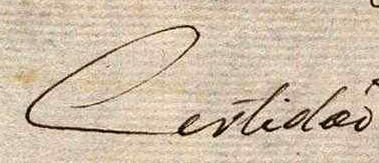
Certidaõ
